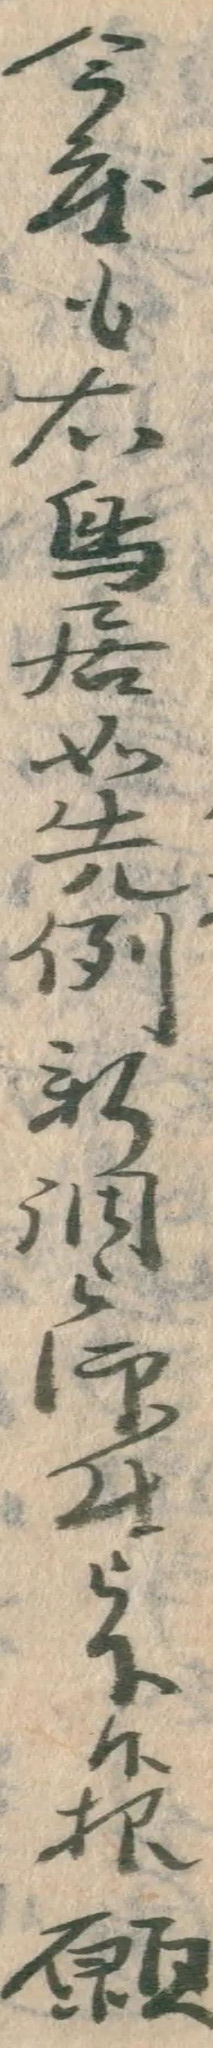今度も右鳥居如先例新調被仰付被下候様願
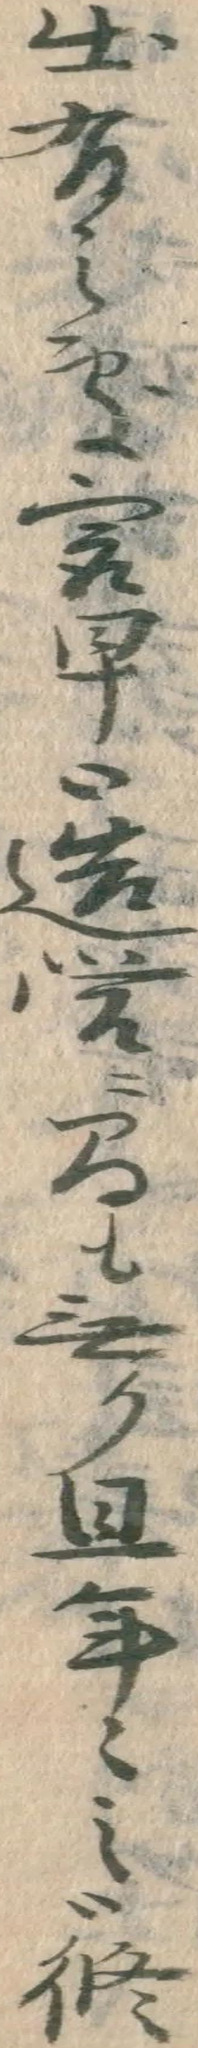出有之處、最早御造営ニ間も無ク且年々之御修
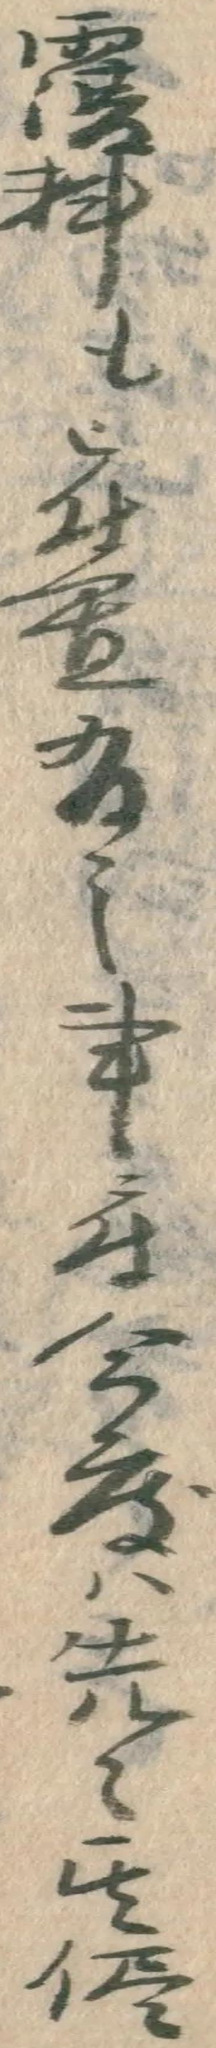覆料も被付置有之事ニ付、今度ハ先〻其儘
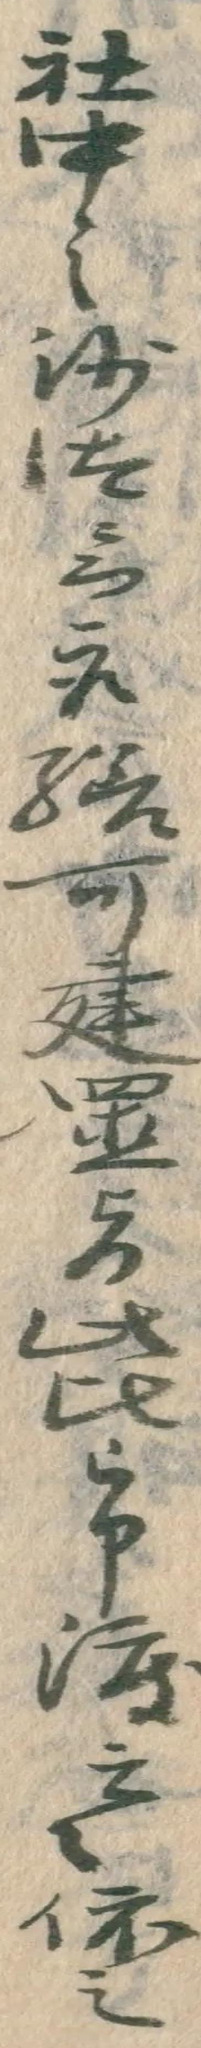社中之沙汰ニ而取繕可建置旨、此比被申渡之云々、依之
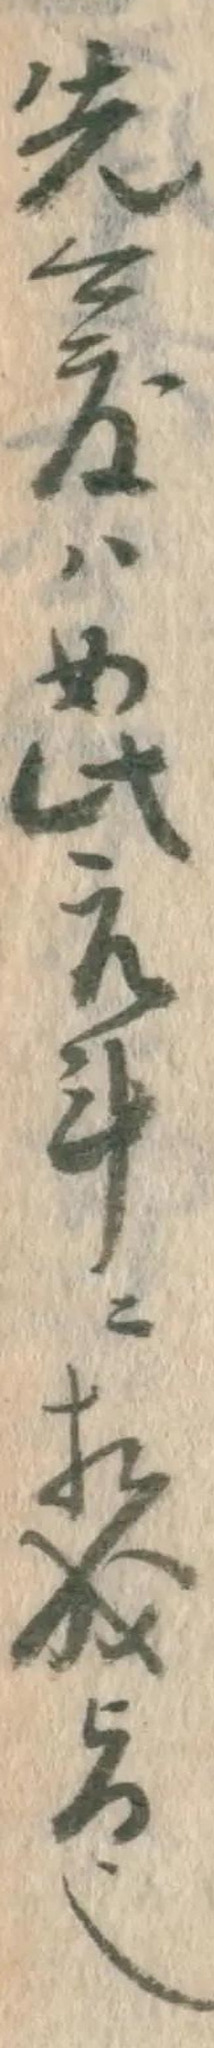先今度ハ如此取斗ニ相成旨也

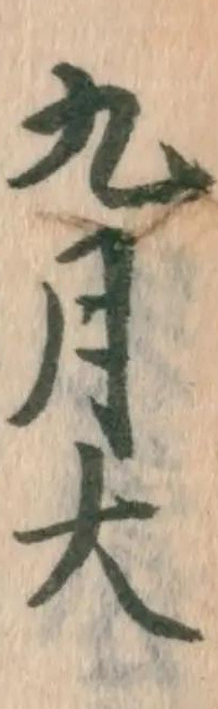九月大
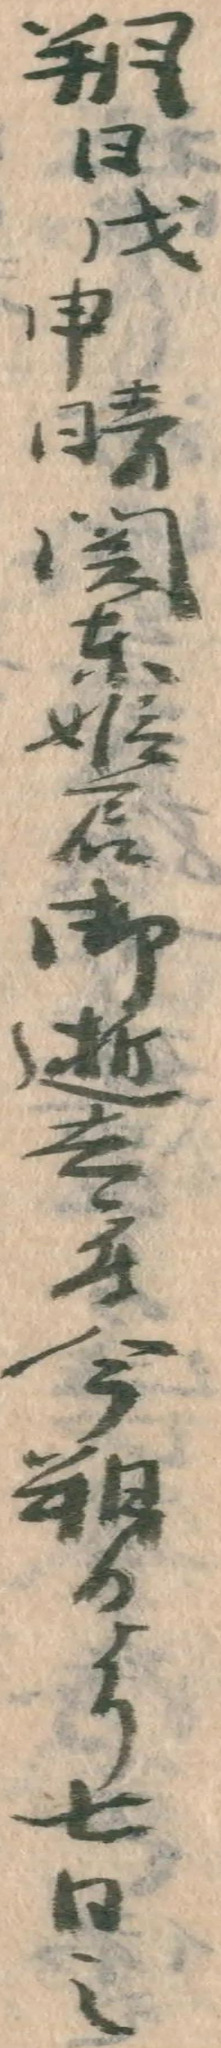朔日戊申晴、関東姫君御逝去ニ付、今朔日より七日之
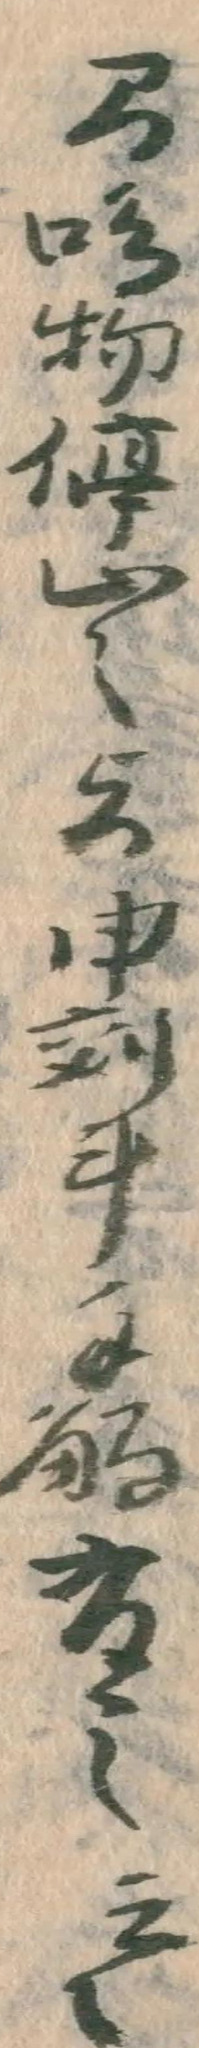間鳴物停止之旨、申刻計手触有之云々、
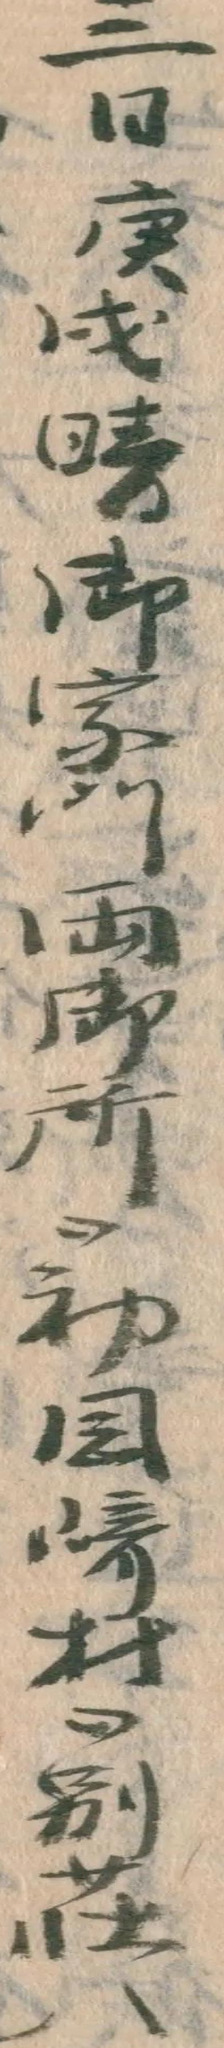三日庚戌晴、御家門両御所御勤岡崎村御別荘へ
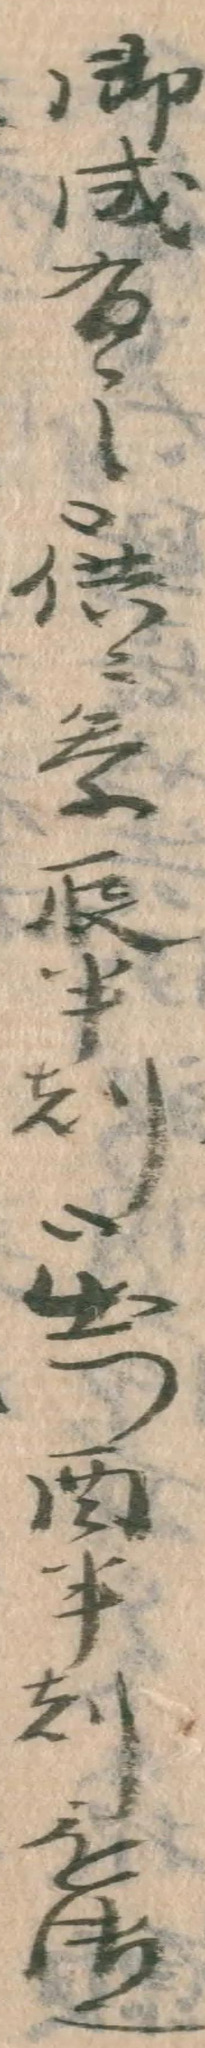御成有之、御供ニ参、辰半刻御出門、酉半刻也、
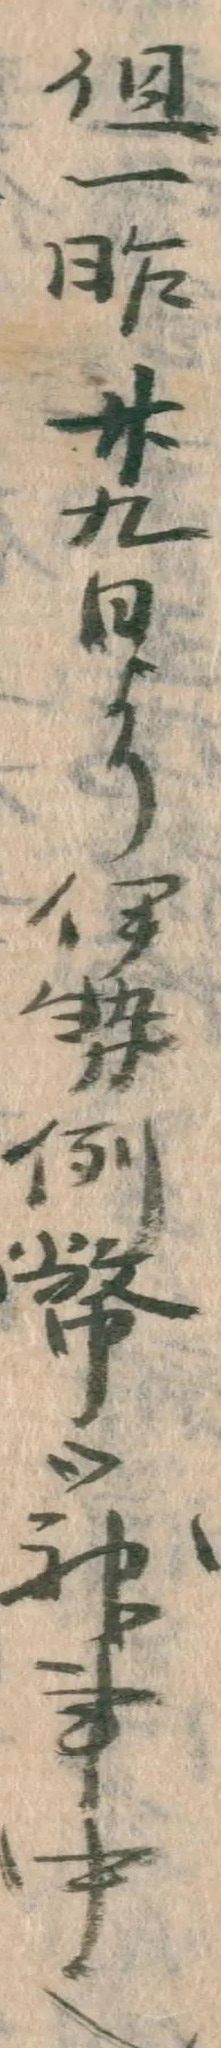但一昨廿九日より伊勢例幣御神事中也、
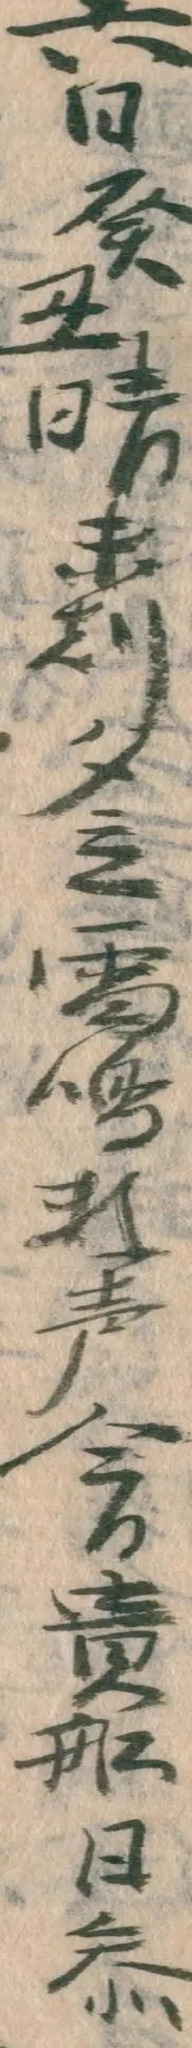六日癸丑晴未刻夕立雷鳴数声、今日貴舩日参
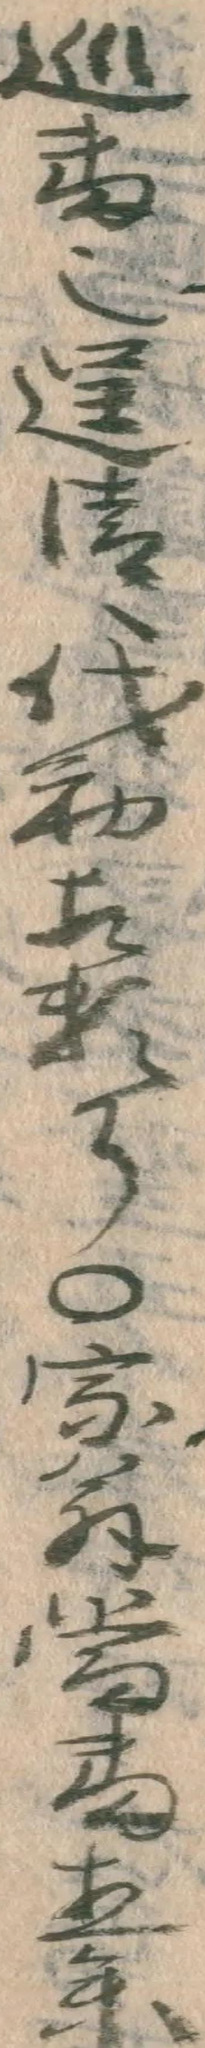巡番也逞清ヘ代勤相頼了、○家翁當番直参
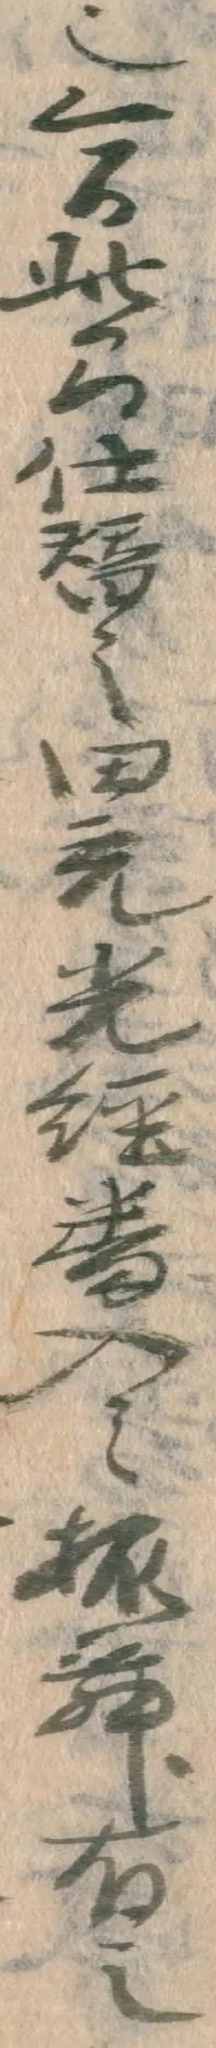也、今日此間仕替之田充光経番入之振舞有之、
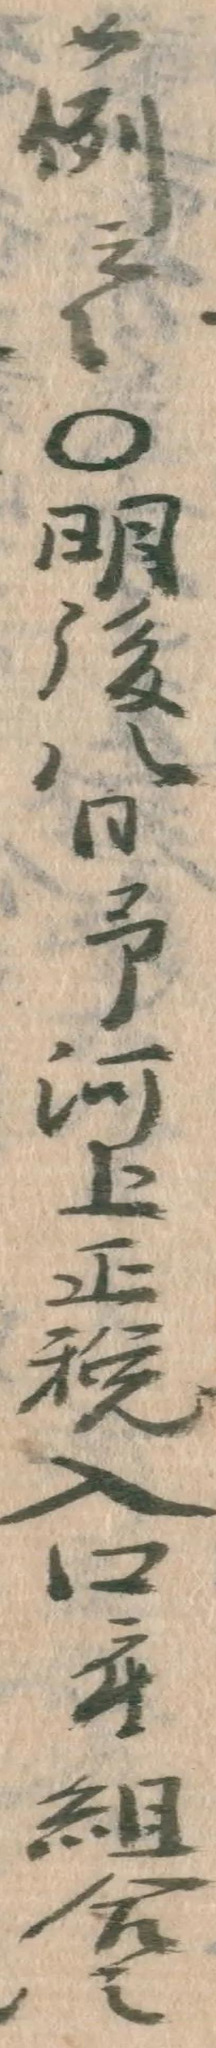如例云々、○明後八日予河上正税入口ニ付、組合之
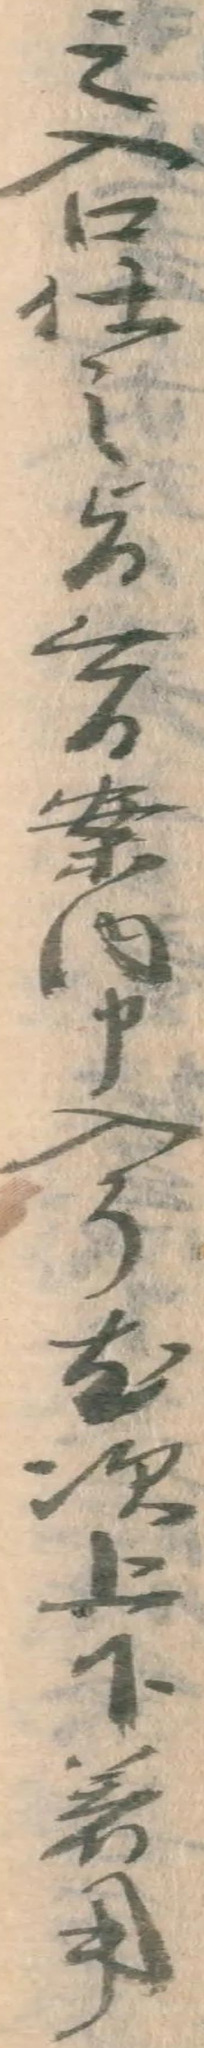之入口仕之旨、今日案内申入候、尤次上下着用
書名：賀茂社記録. 第63冊
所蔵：国立国会図書館 National Diet Library, JAPAN
